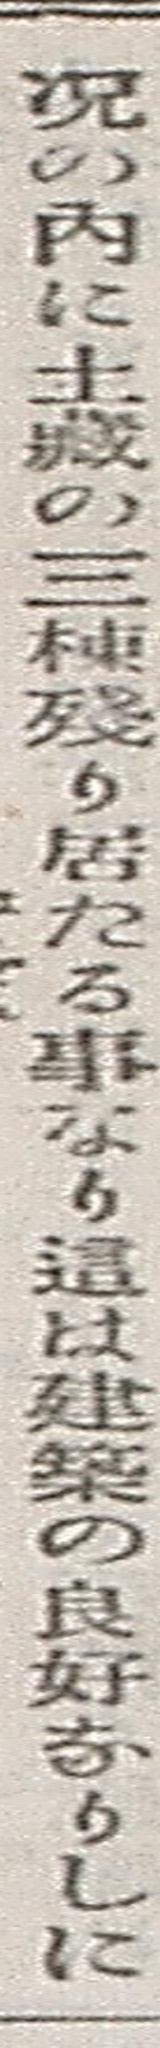况の内に土蔵の三棟残り居たる事なり這は建築の良好なりしに
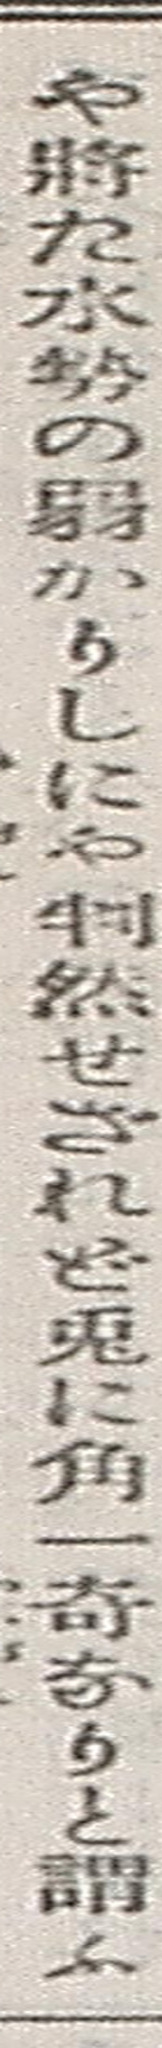や将た水勢の弱かりしにや判然せざれど兎に角一奇なりと謂ふ
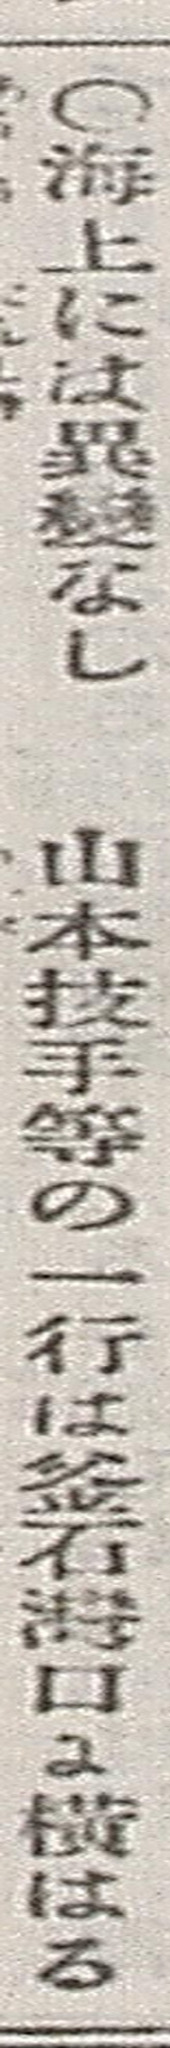○海上には異変なし山本技手等の一行は釜石湾口に横はる
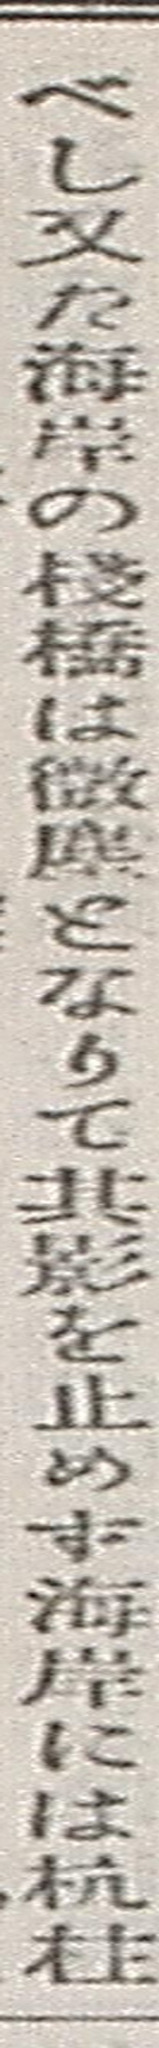べし又た海岸の桟橋は微塵となりて其影を止めず海岸には杭柱
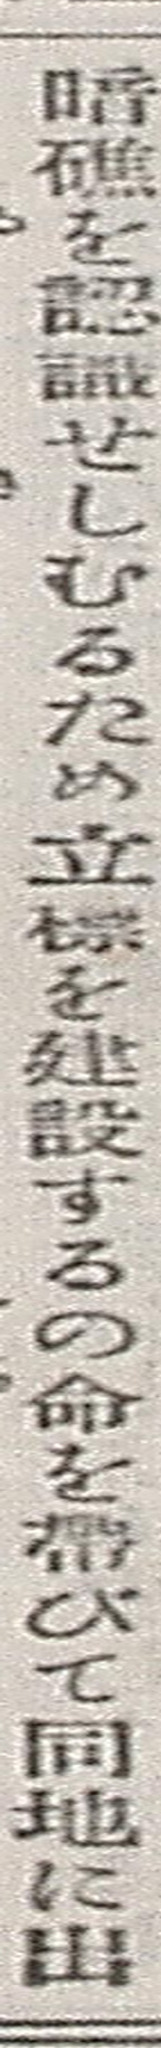暗礁を認識せしむるため立標を建設するの命を帯びて同地に出
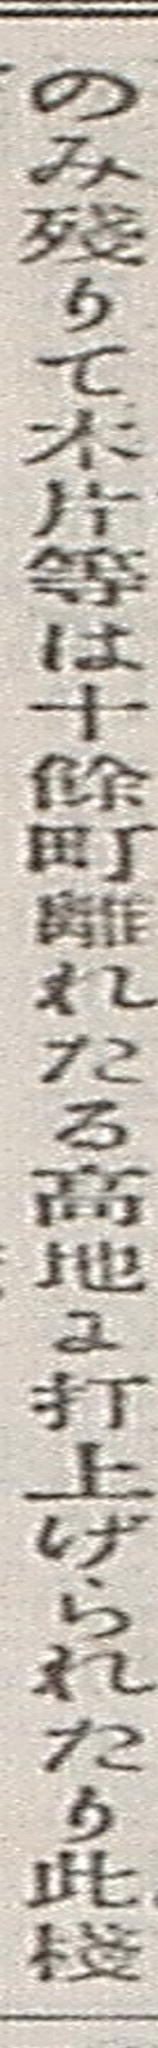のみ残りて木片等は十余町離れたる高地に打上げらりたり此桟
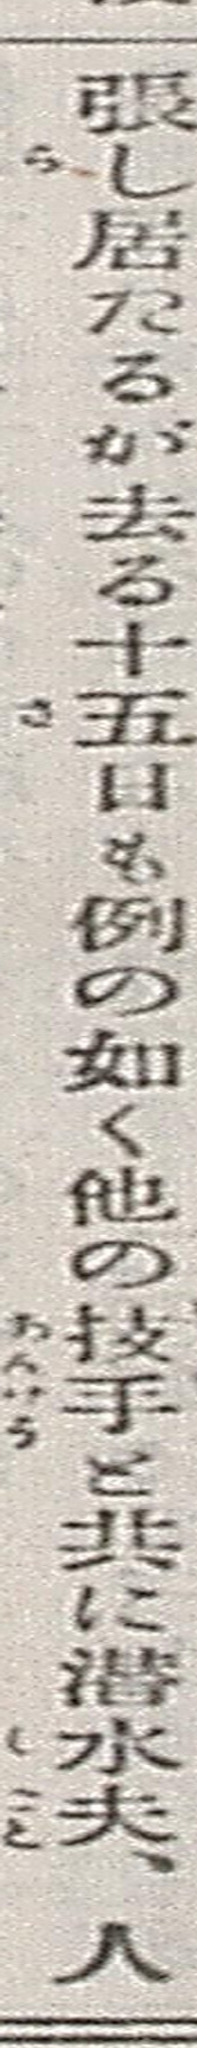張し居たるが去る十五日も例の如く他の技手と共に潜水夫、人
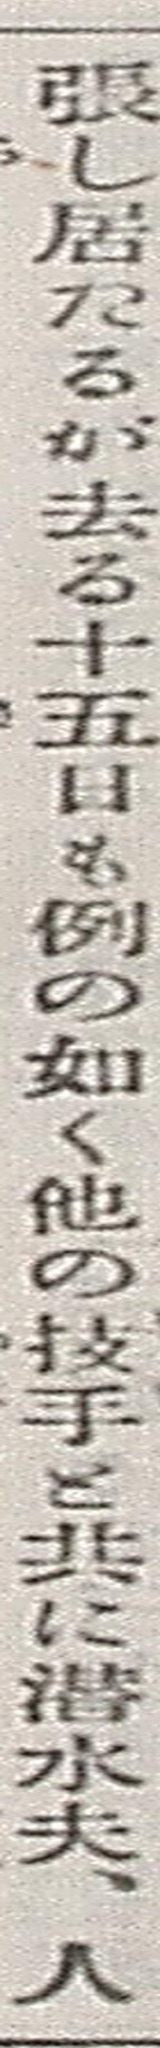張し居たるが去る十五日も例の如く他の技手と共に潜水夫、人
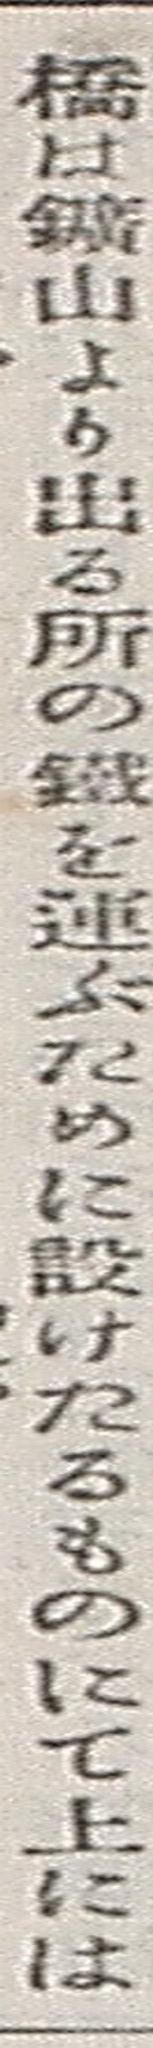橋は鉱山より出る所の鉄を運ぶために設けたるものにて上には
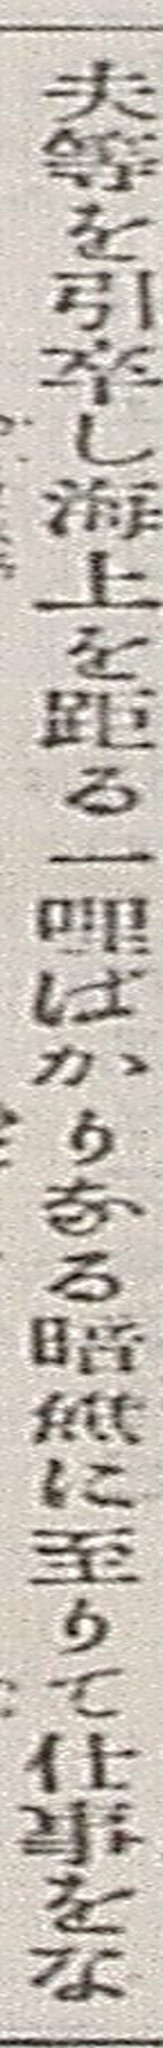夫等を引率し海上を距る一哩ばかりなる暗礁に至りて仕事をな
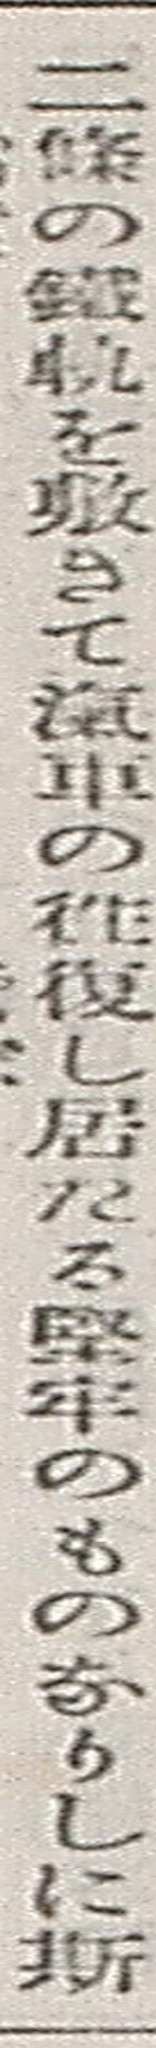二条の鉄軌を敷きて汽車の往復し居たる堅牢のものなりしに斯
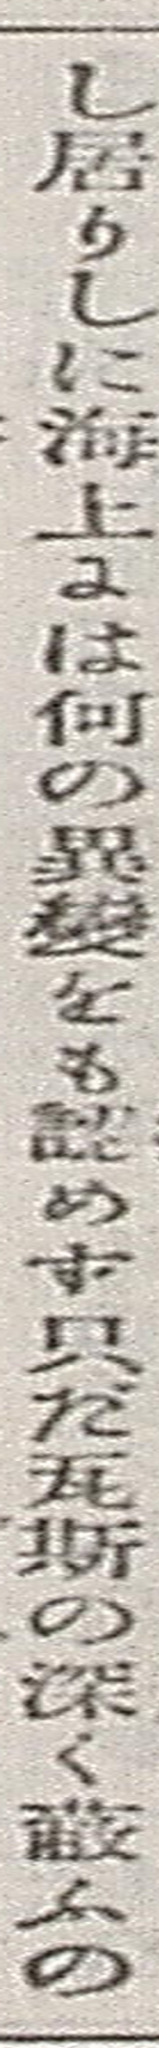し居りしに海上には何の異変をも認めず只だ瓦斯の深く蔽ふの
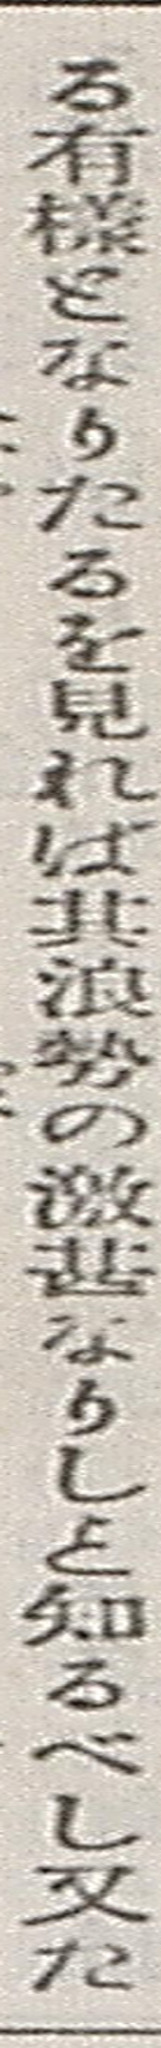る有様となりたるを見れば其浪勢の激甚なりしこと知るべし又た
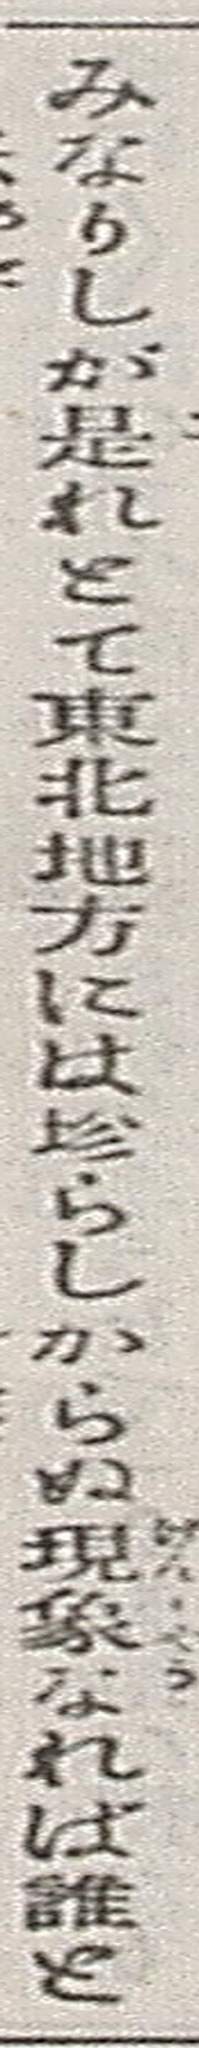みなりしが是れとて東北地方には珍らしからぬ現象なれば誰と
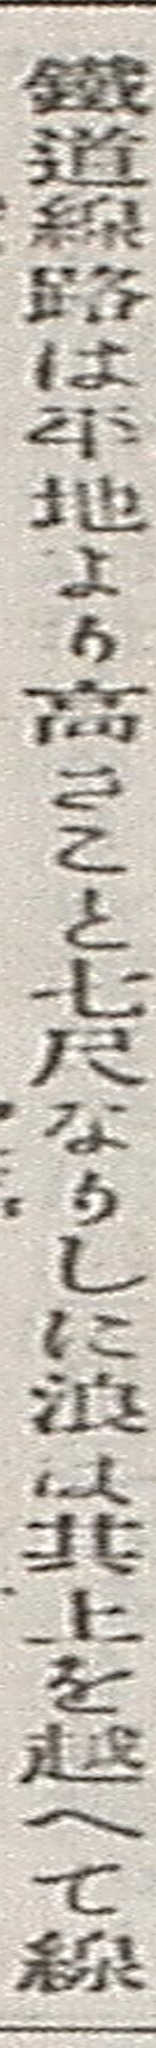鉄道線路は平地より高きこと七尺なりしに浪は其上を越へて線
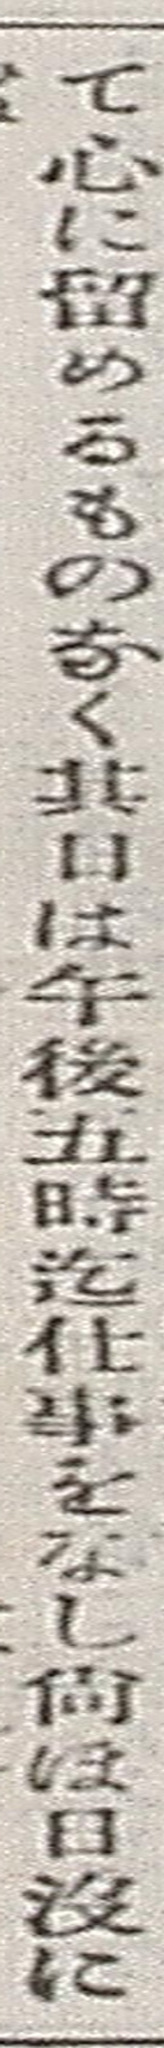て心に留めるものなく其日は午後五時迄仕事をなし尚ほ日没に
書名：風俗畫報臨時増刊第百二十號　大海嘯被害録（下）
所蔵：東京大学地震研究所図書室 Earthquake Research Institute Library, The University of Tokyo, JAPAN
